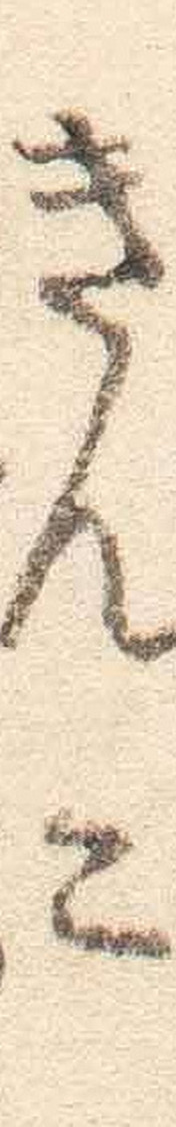きんこ
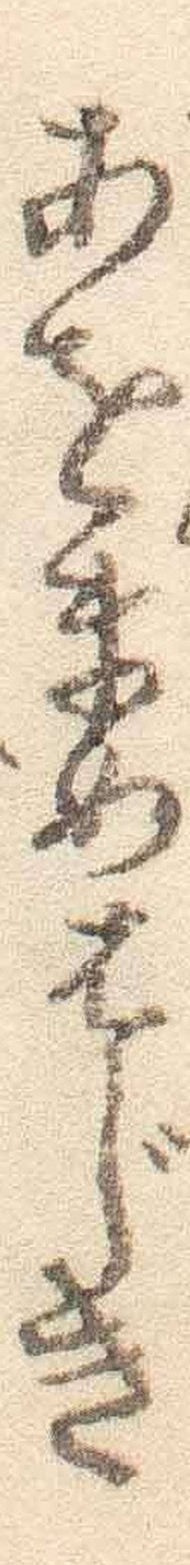あをまめはじき
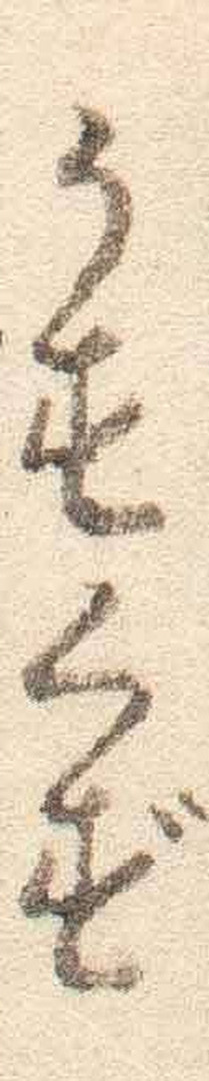うすくず
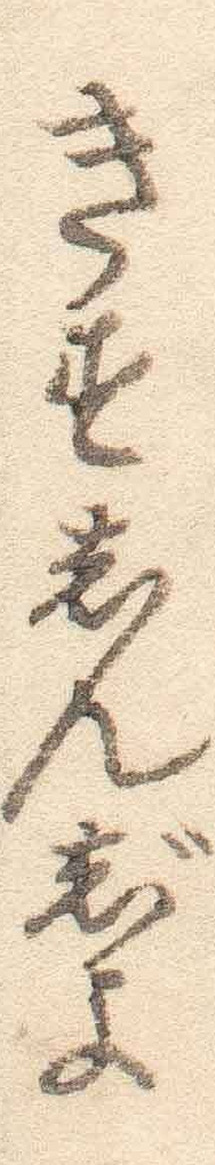きすしんじよ
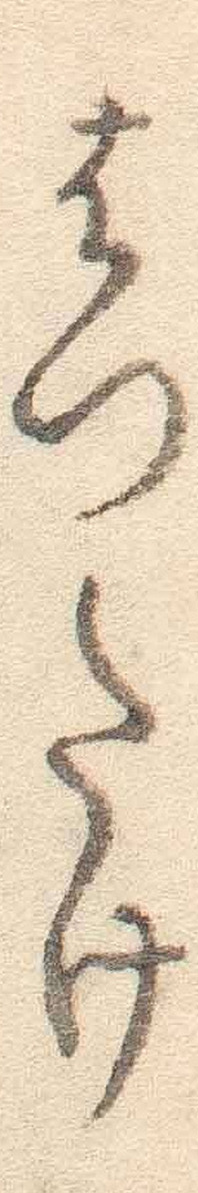はつたけ
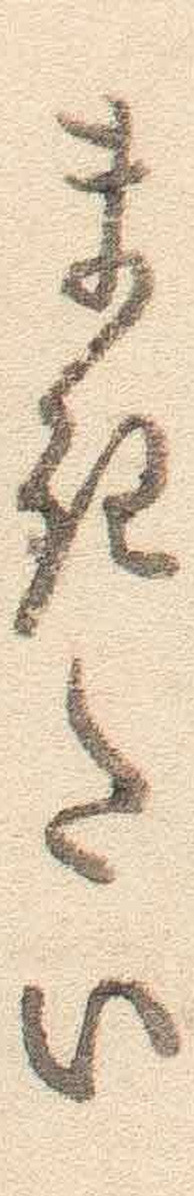まきたい
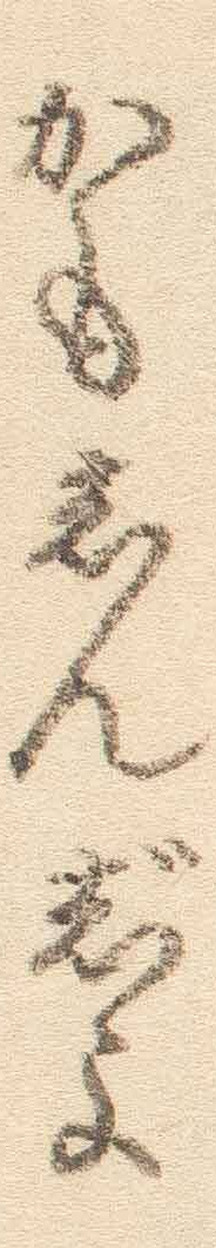ゑびしんじよ
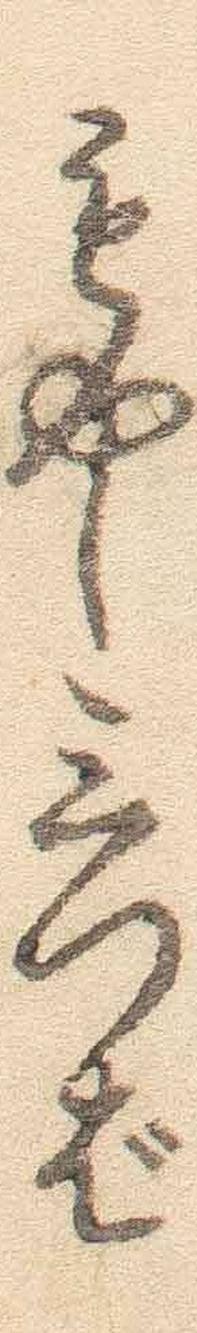もやし三つば
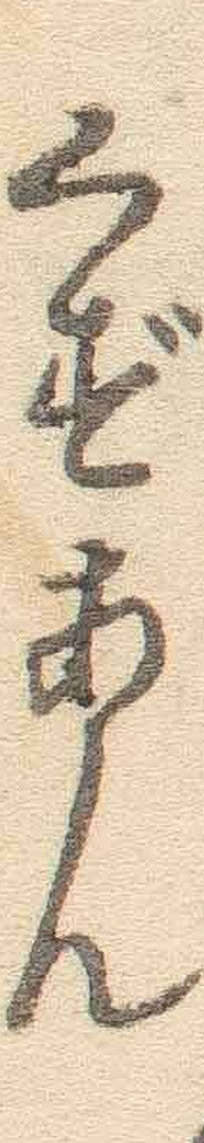くずあん
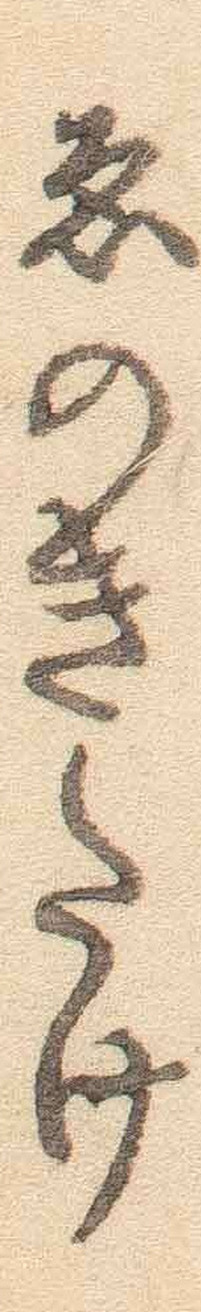ゑのきたけ
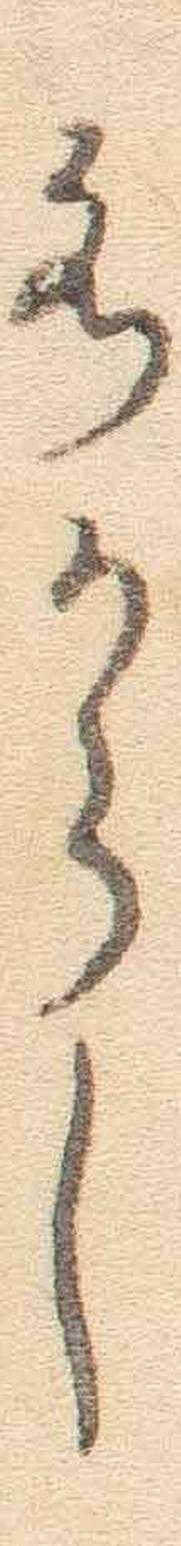水からし

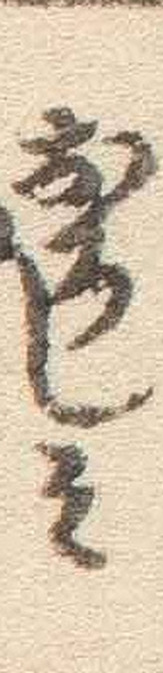おろしみ
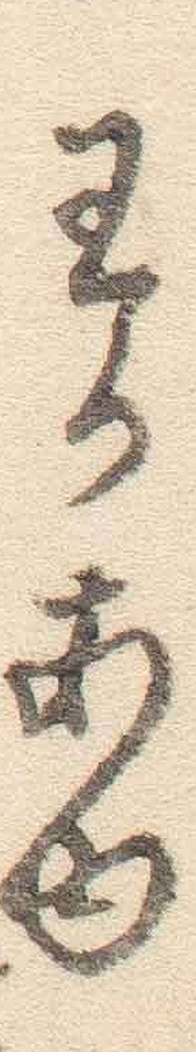わかあゆ
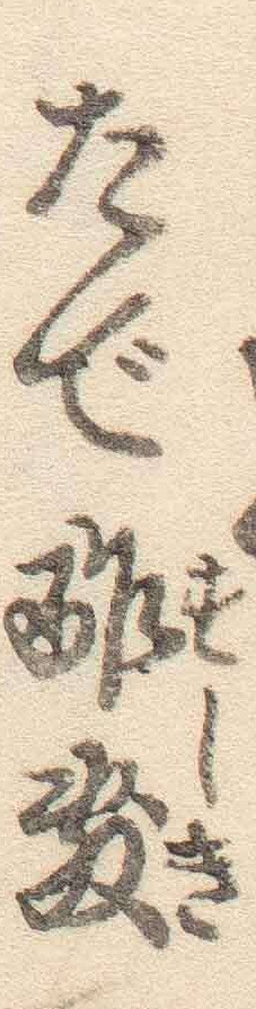たで酢敷
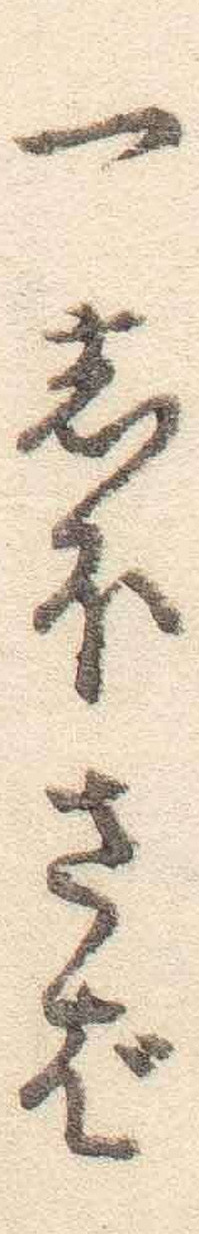一しほさば
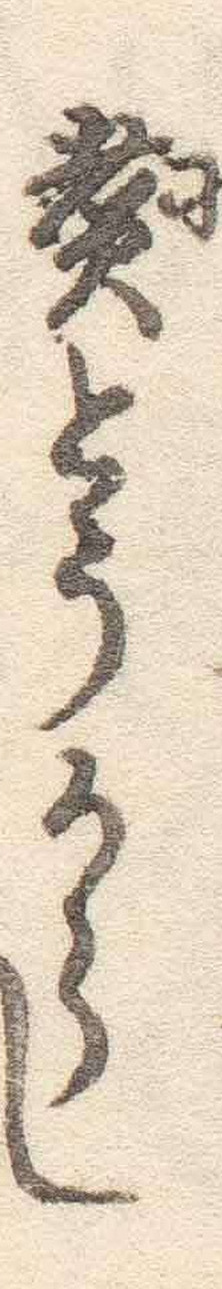煮とうからし
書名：料理通
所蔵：東京学芸大学附属図書館 国文学研究資料館
